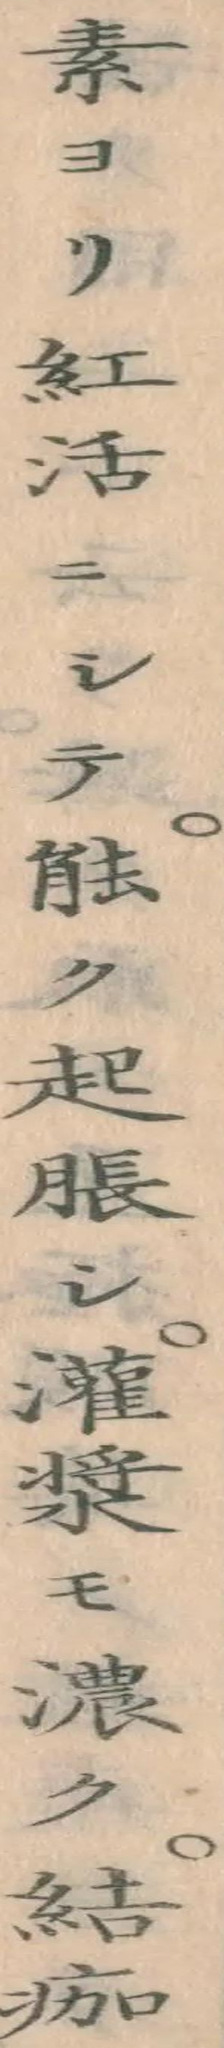素ヨリ紅活ニシテ。能ク起脹シ。灌漿モ濃ク。結痂
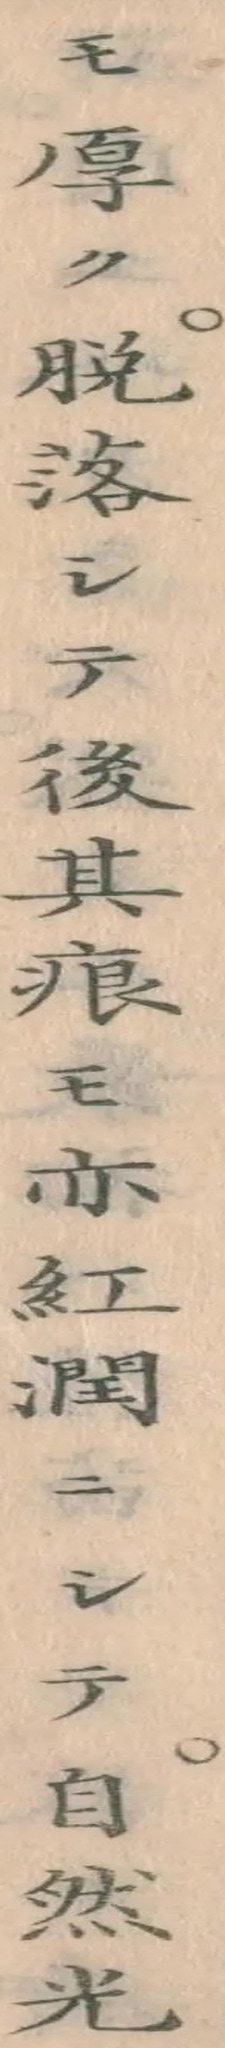モ厚ク。脱落シテ後其痕モ亦紅潤ニシテ。自然光
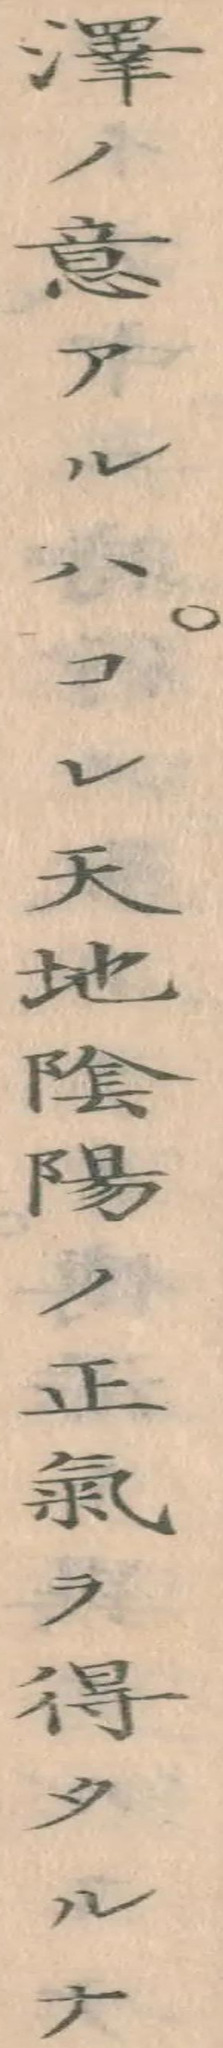沢ノ意アルハ。コレ天地陰陽ノ正気ヲ得タルナ
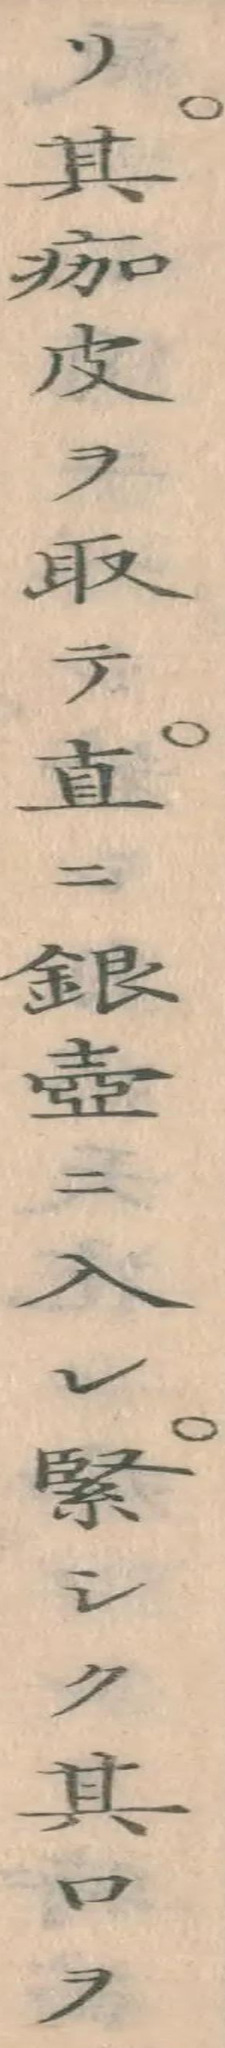リ。其痂皮ヲ取テ。直ニ銀壺ニ入レ。緊シク其口ヲ
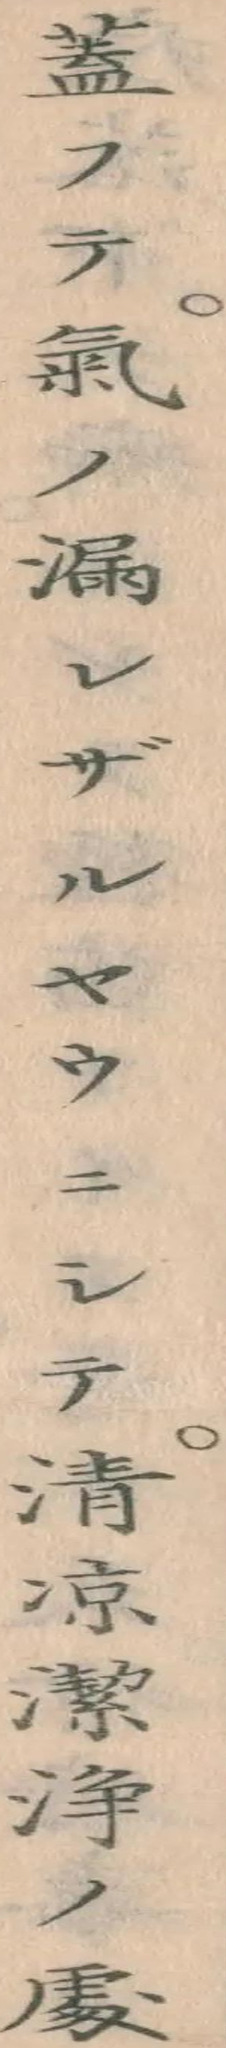蓋フテ。気ノ漏レザルヤウニシテ。清涼潔浄ノ処
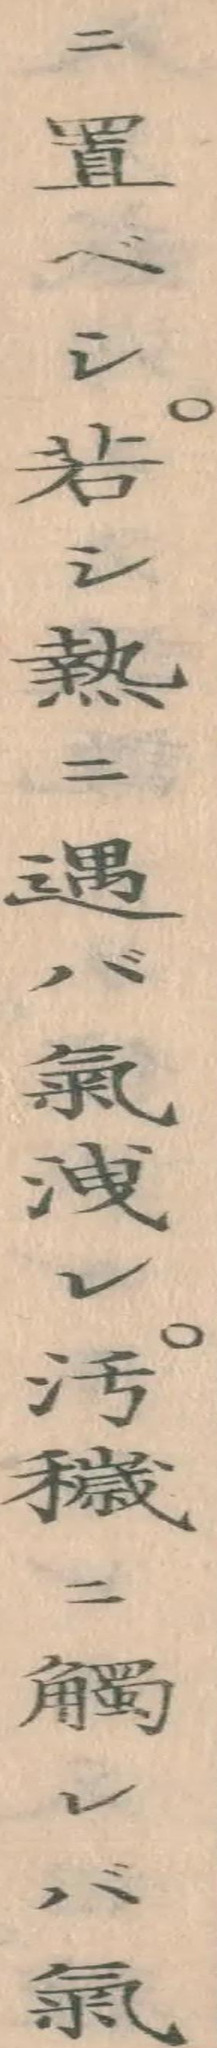ニ置ベシ。若シ熱ニ遇バ気洩レ。汚穢ニ触レバ気
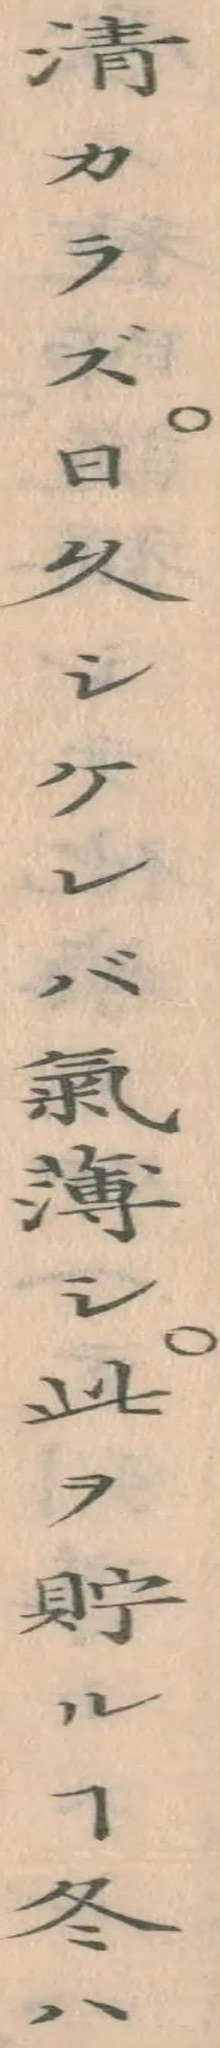清カラズ。日久シケレバ気薄シ。此ヲ貯ルヿ冬ハ
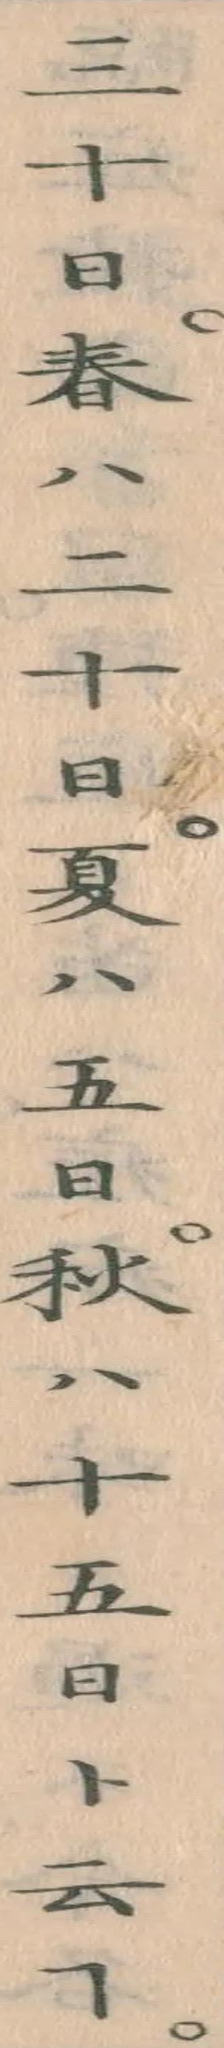三十日。春ハ二十日。夏ハ五日。秋ハ十五日ト云ヿ。
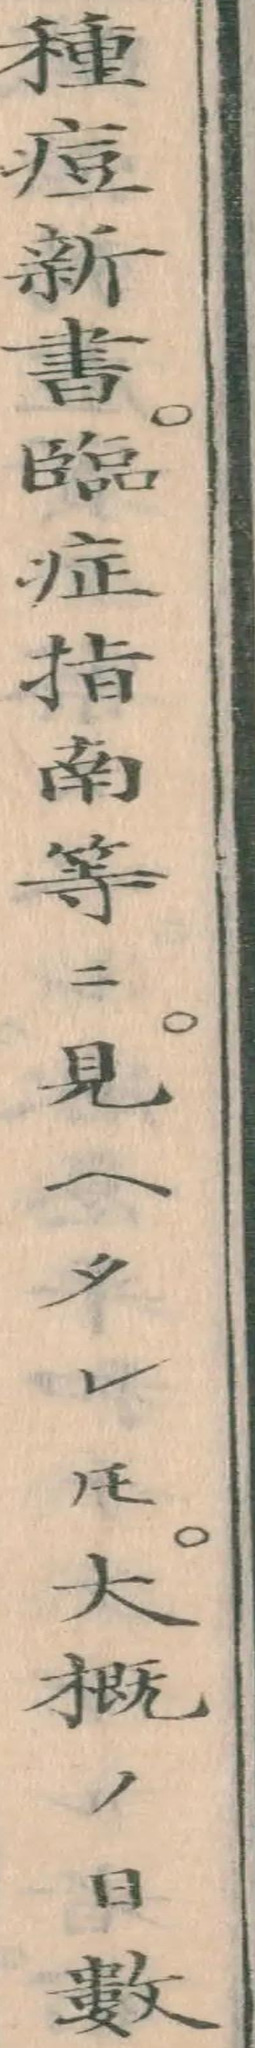種痘新書。臨症指南等ニ。見ヘタレ𪜈。大概ノ日数
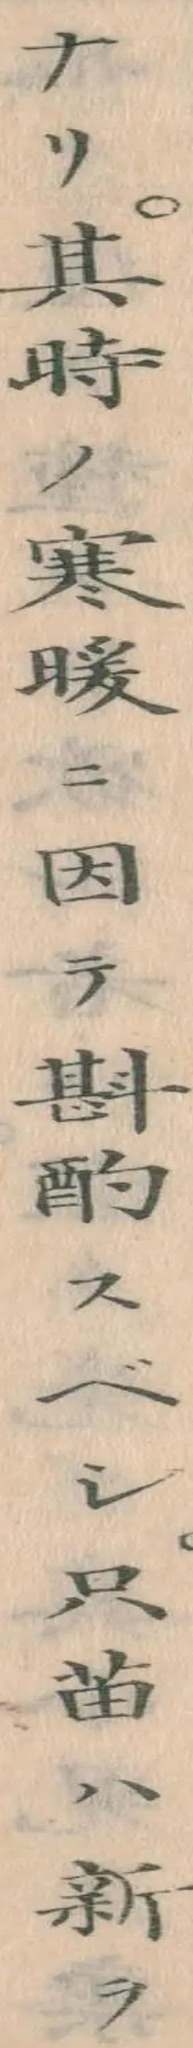ナリ。其時ノ寒暖ニ因テ斟酌スベシ。只苗ハ新ヲ
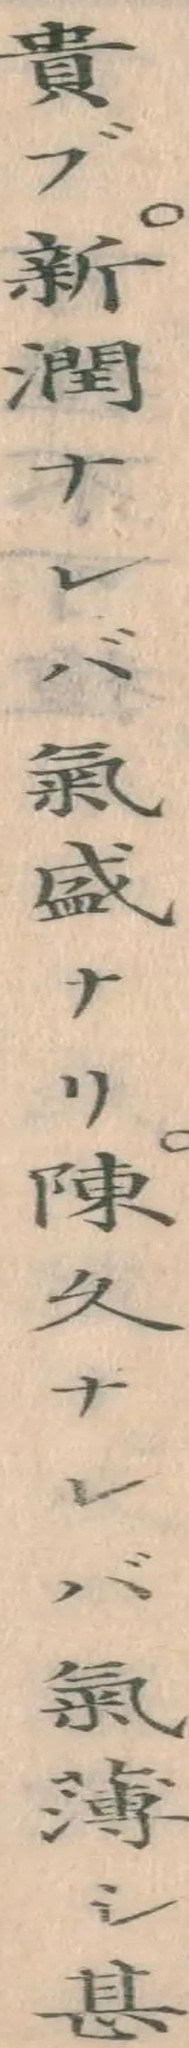貴ブ。新潤ナレバ気盛ナリ。陳久ナレバ気薄シ。甚
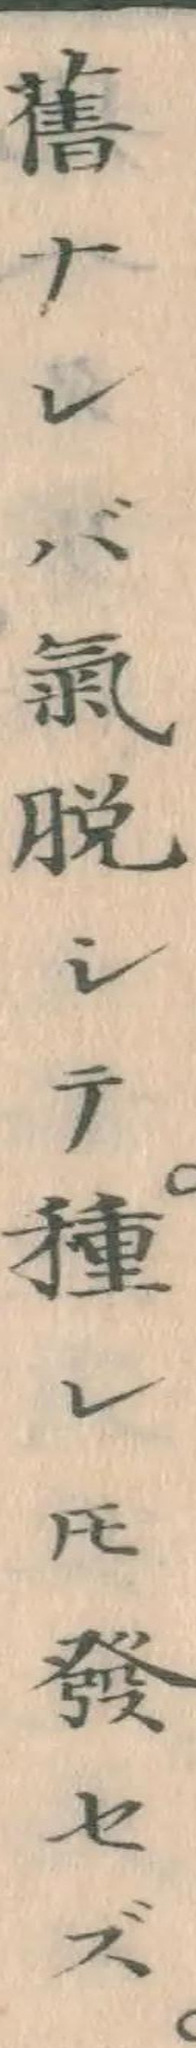旧ナレバ気脱シテ。種レ𪜈発セズ。
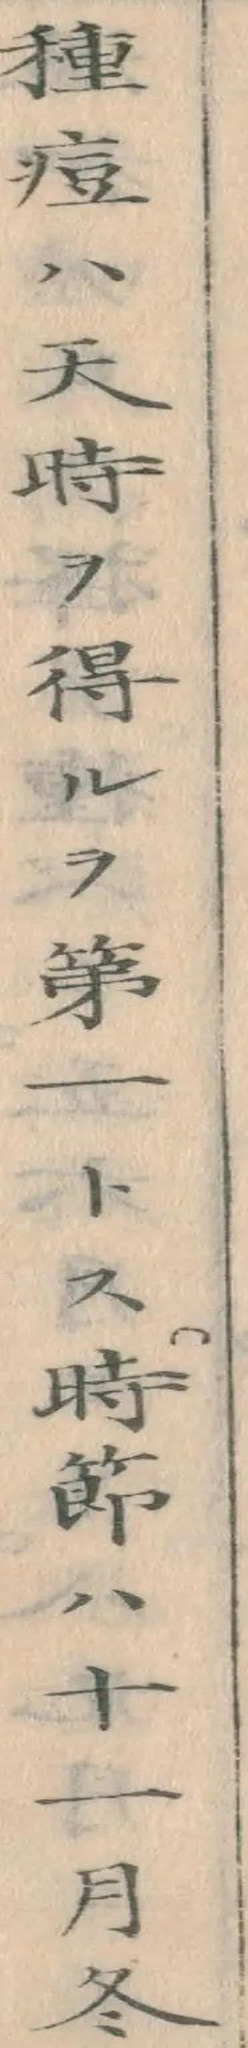種痘ハ天時ヲ得ルヲ第一トス。時節ハ十一月冬
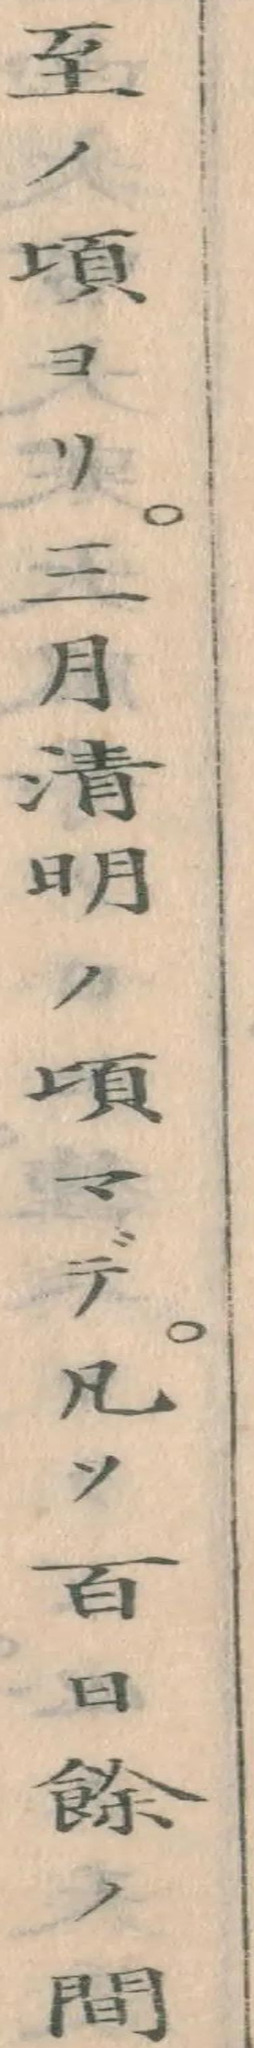至ノ頃ヨリ。三月清明ノ頃マデ。凡ソ百日余ノ間
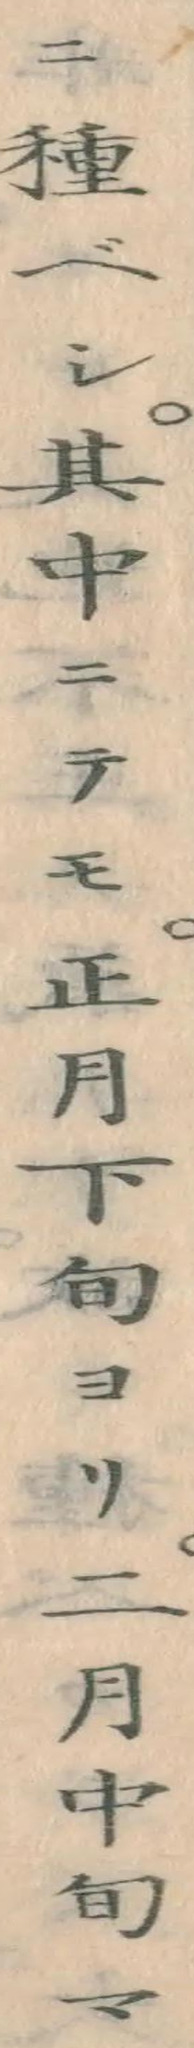ニ種ベシ。其中ニテモ。正月下旬ヨリ。二月中旬マ
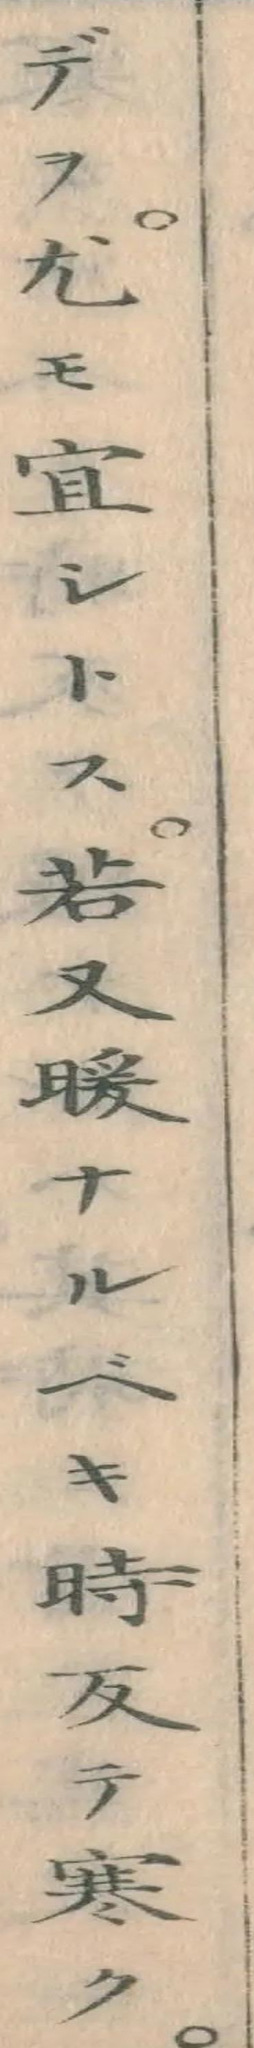デヲ。尤モ宜シトス。若又暖ナルベキ時反テ寒ク。
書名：種痘弁義
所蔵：国立国会図書館 National Diet Library, JAPAN
